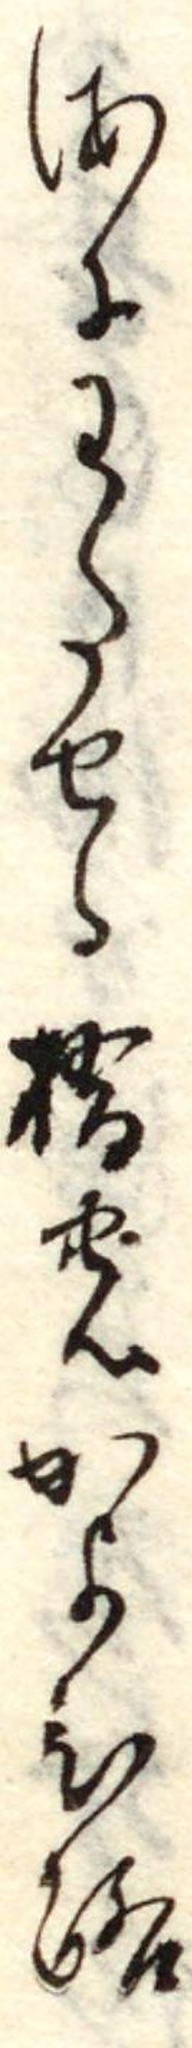海にわたせる橋のかよひ路
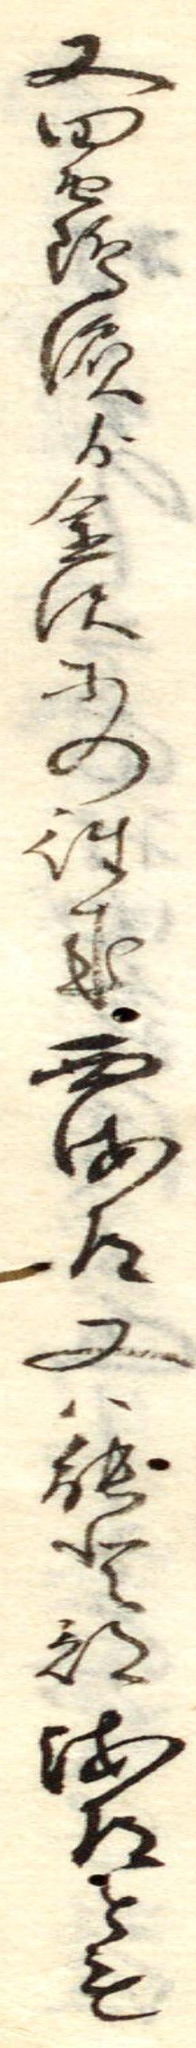又田鶴浜ゟ金沢にの往来西海道又は能登郡海道とも
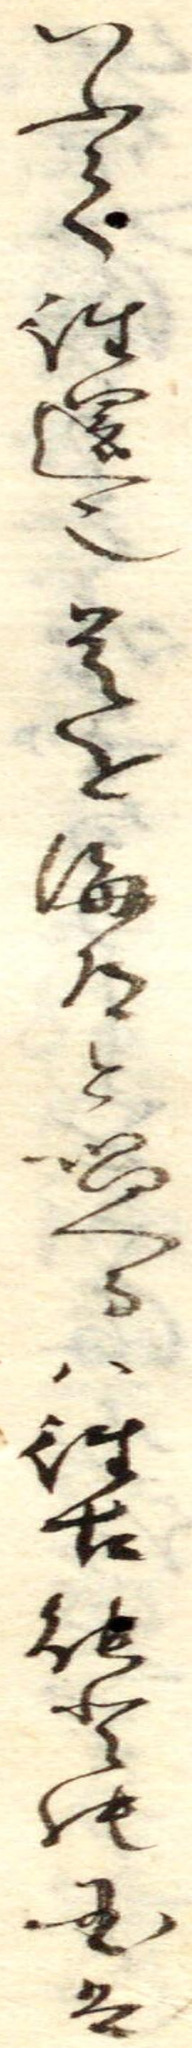いふて往還也是を海道と唱へるは往古能登の国は

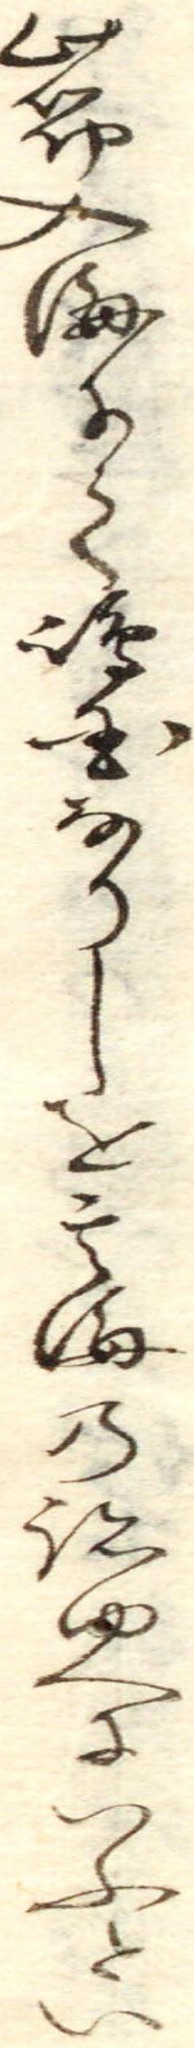此筋入海にて嶋国なりしを其海の跡ゆへにいふとい
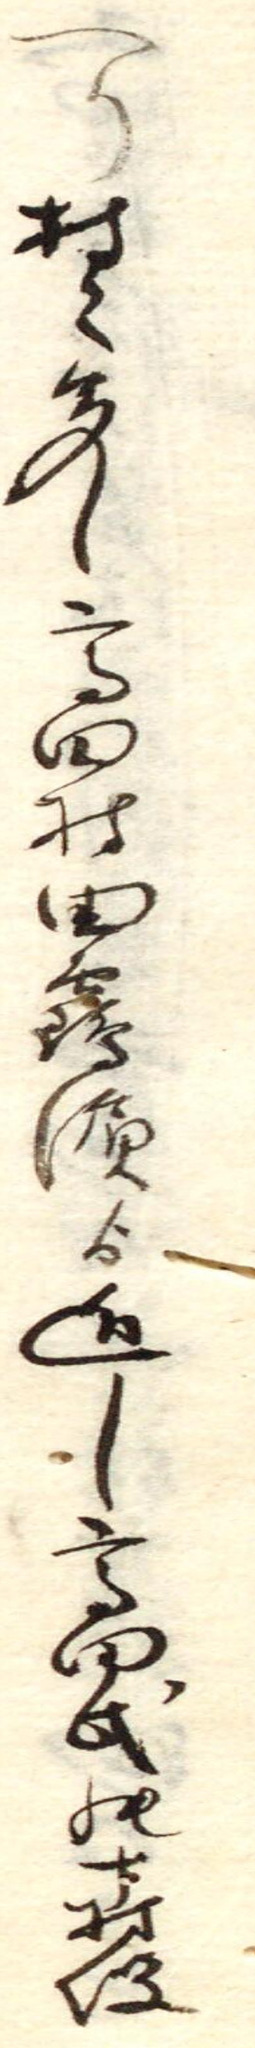へり村々多し高田村田鶴浜ゟ近し高田氏の十村役
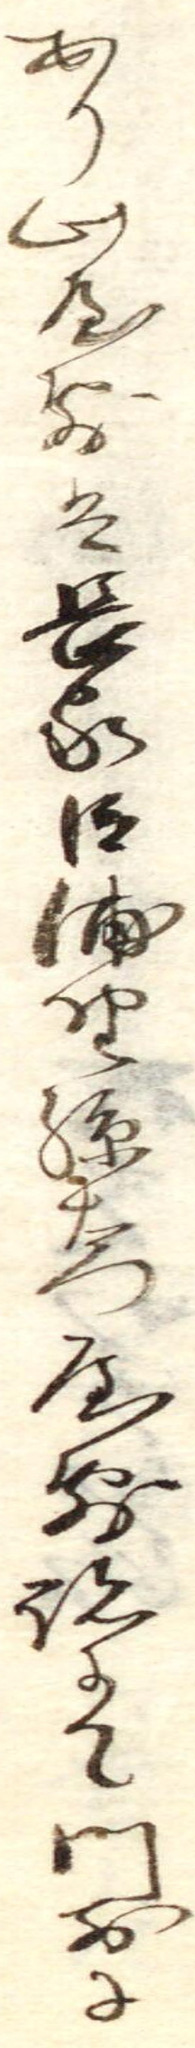あり此屋敷は長家臣浦野孫右衛門屋敷跡にて門前に
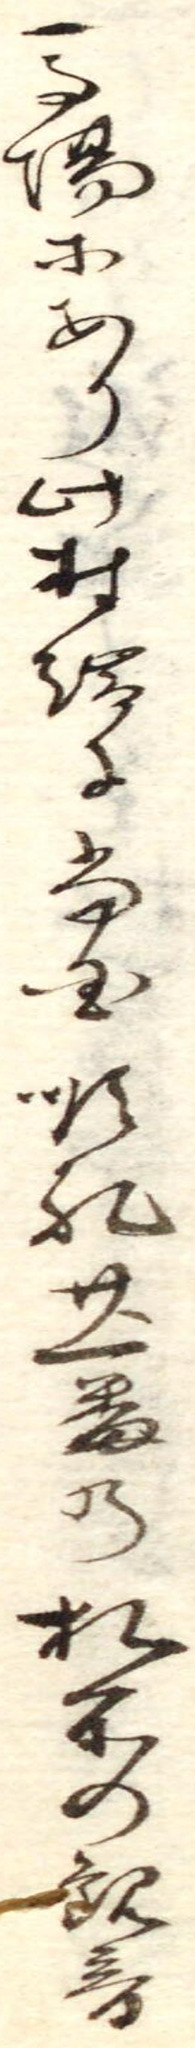馬場等あり此村端に当国順礼廿一番の札所の観音
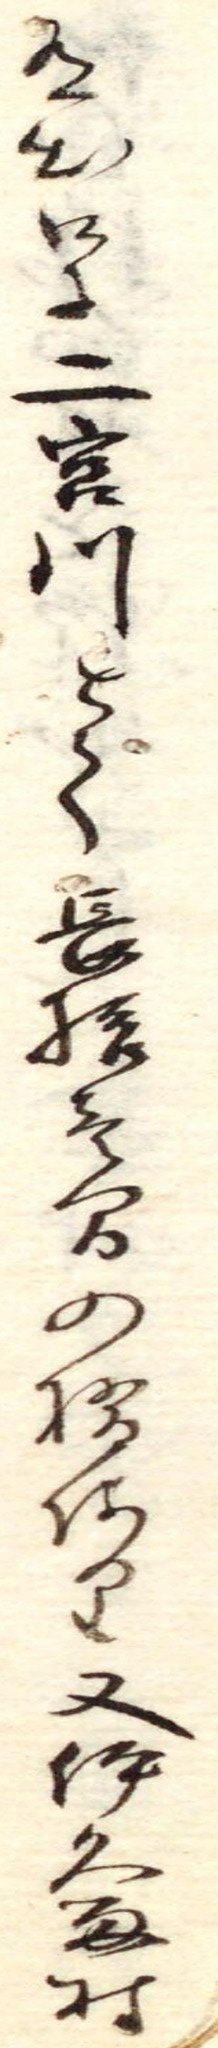有出口に二宮川とて長拾壱間の橋あり又伊久留村
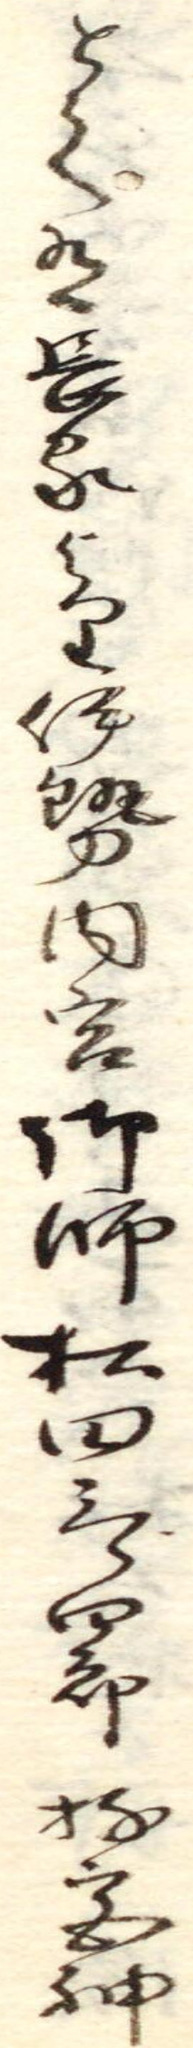とて有長家より伊勢内宮御師松田三郎四郎持宮神
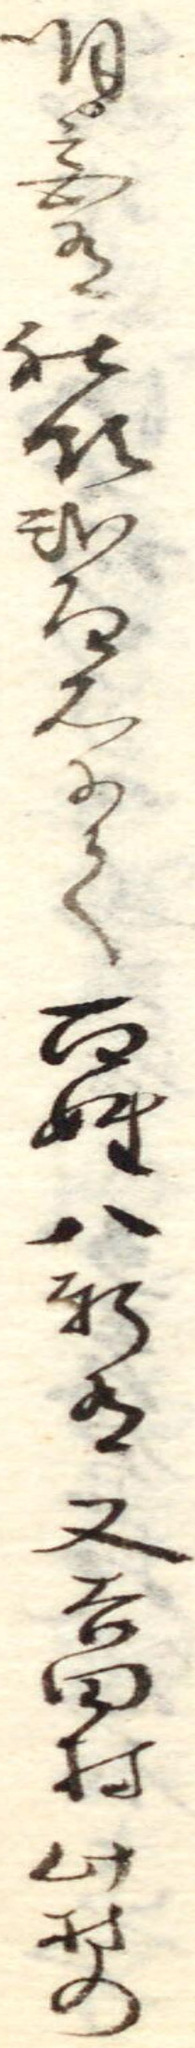明宮有社領弐百石にて百姓八軒有又吉田村此村の
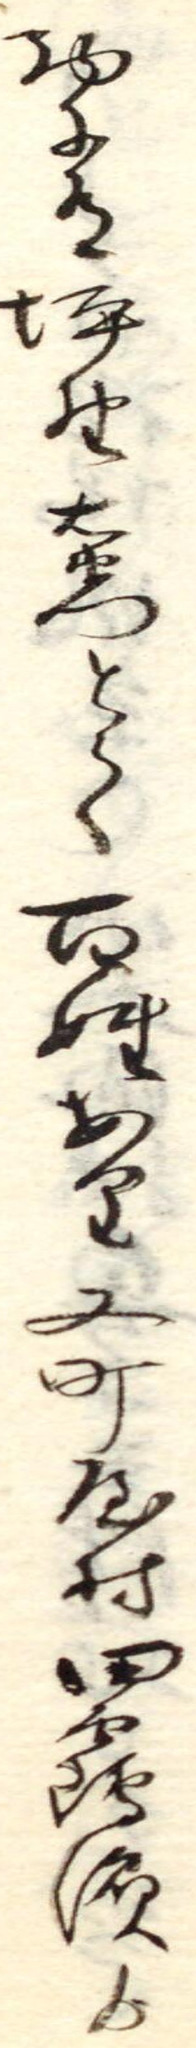西に有坪野右衛門とて百姓あり又町屋村田鶴浜ゟ
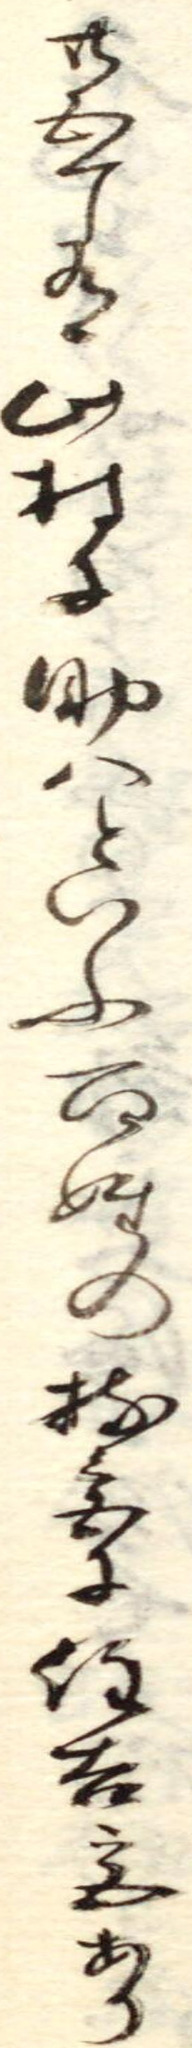廿五丁有此村に助八といふ百姓の持宮に住吉宮あり
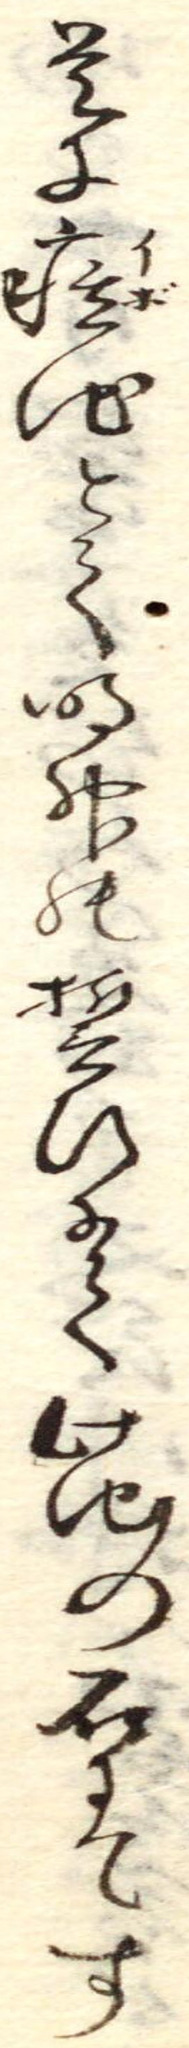是に疣地とて明神の誓ひにて此地の石にてす
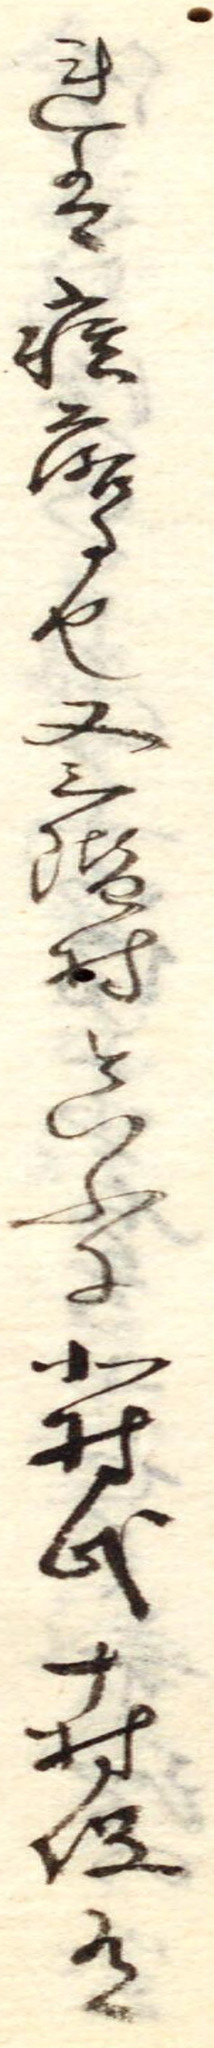れは疣落る也又三階村といふに北村氏十村役有
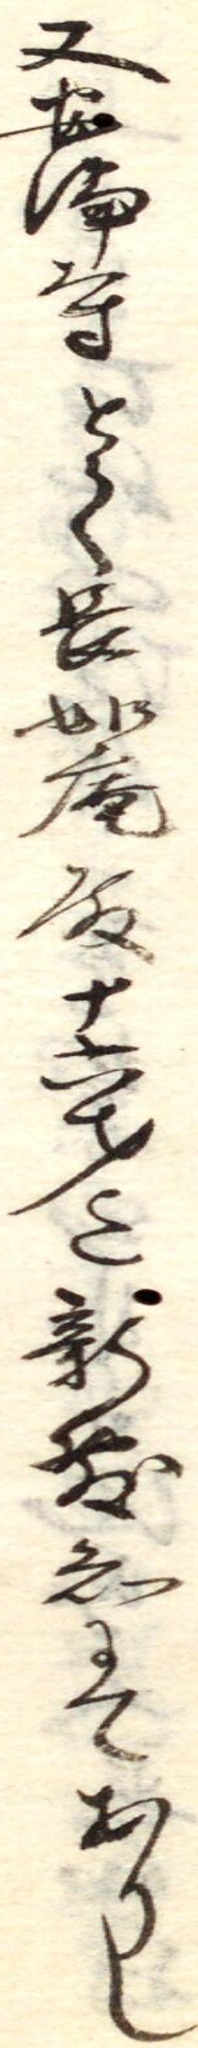又安浄寺とて長如庵殿十六才迄新敷知にてありし
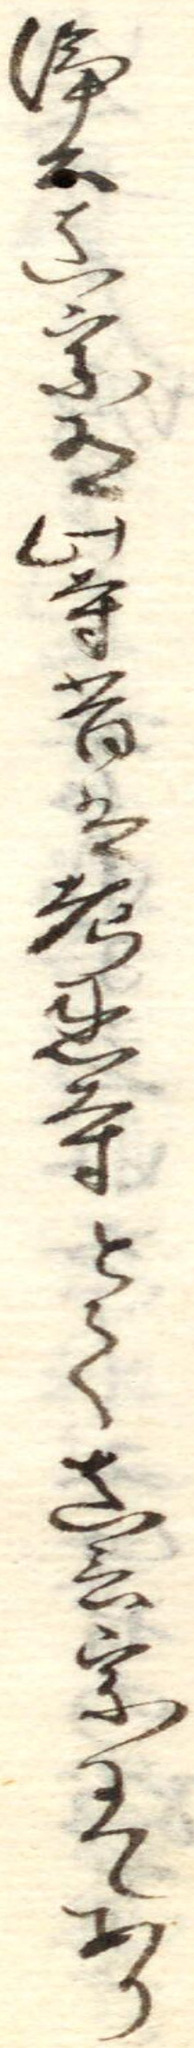浄土真宗有此寺昔は考恩寺とて真言宗にてあり
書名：能登名跡誌
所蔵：Ishikawa Prefectural Library
